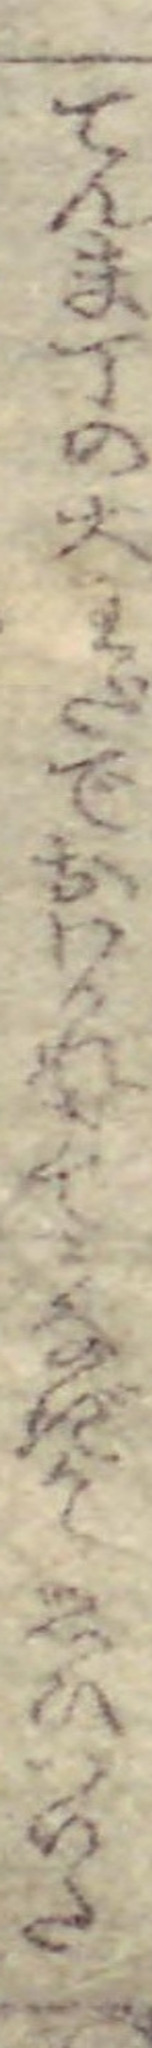てんま丁の大わだでおはかれてうなぎから思ひついた
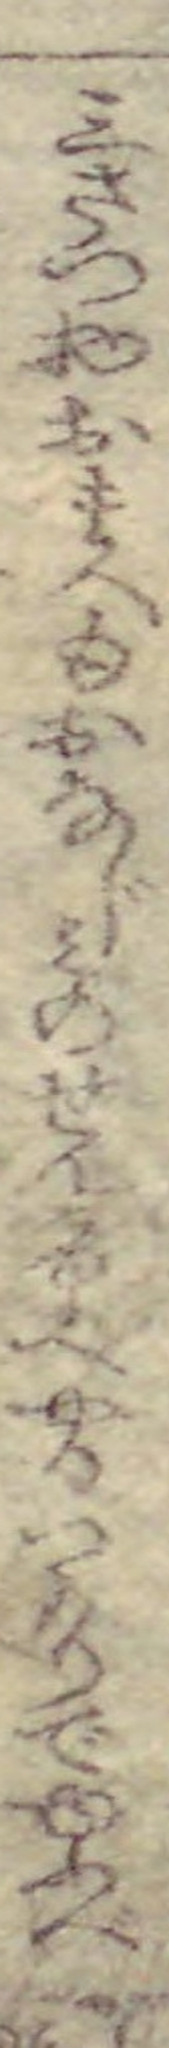三さつ物おまへもおなじみのせん市へやるつもりでゆふべ
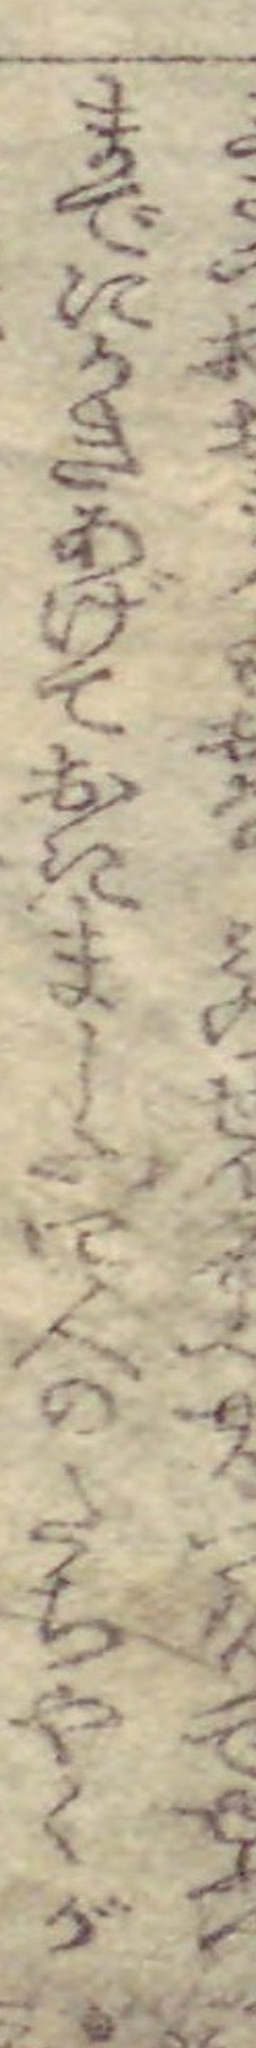までにかきあげておきました四人のたちやくが
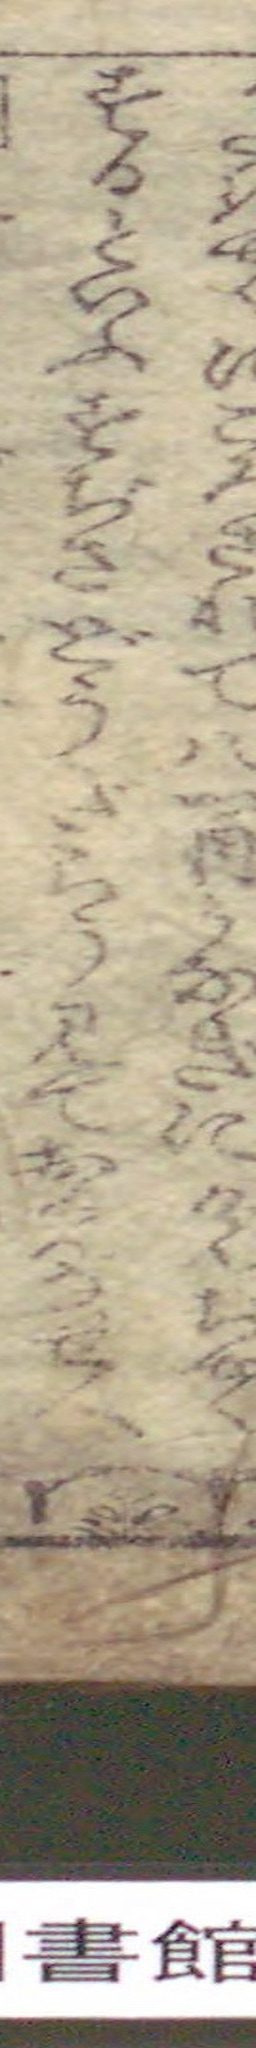するといふすぢさどうだらう見ておくんなせへ
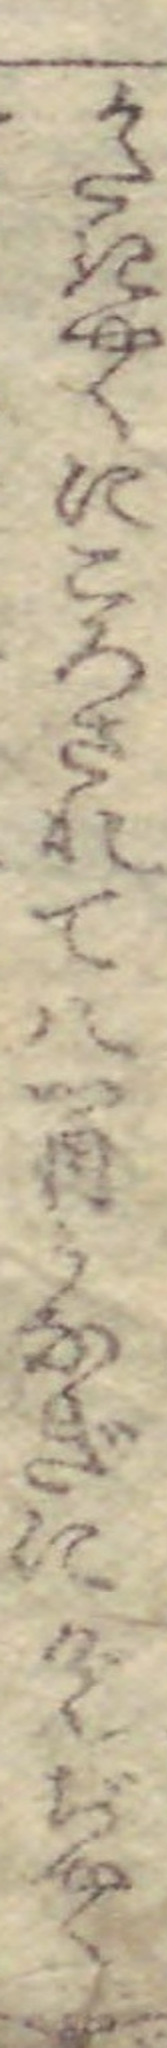かたきやくにころされて八ッ目うなぎにげんぢやく
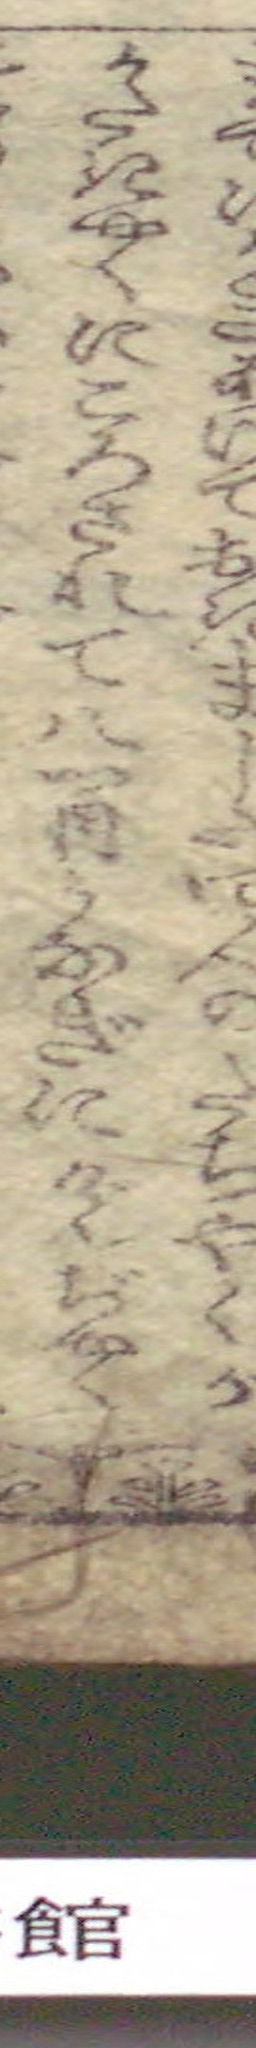かたきやくにころされて八ッ目うなぎにげんぢやく
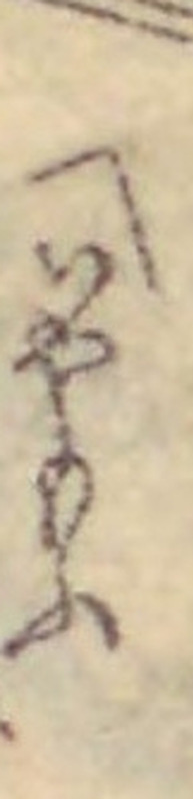〽いやもふ
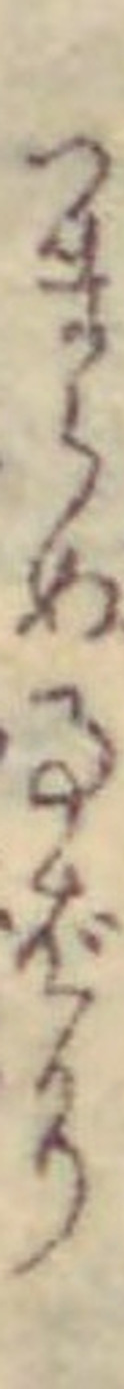つまらぬ事ばかり
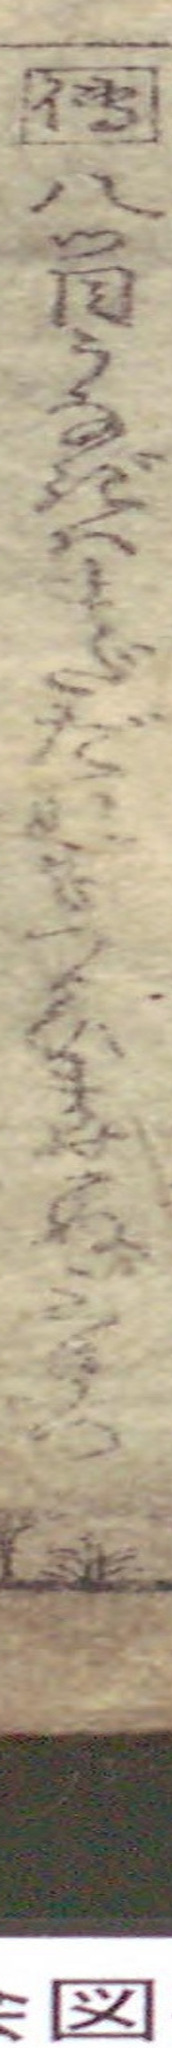[伝]八ッ目うなぎはまだだれもつかひませぬ三さつ
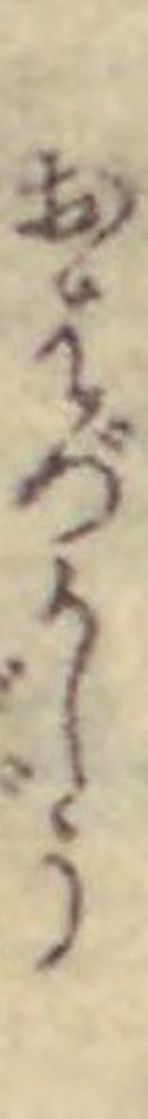おはづかしう
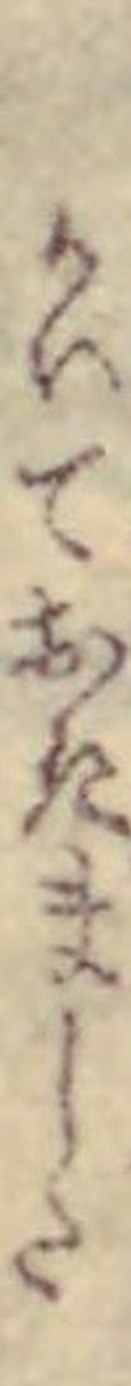かいておきました
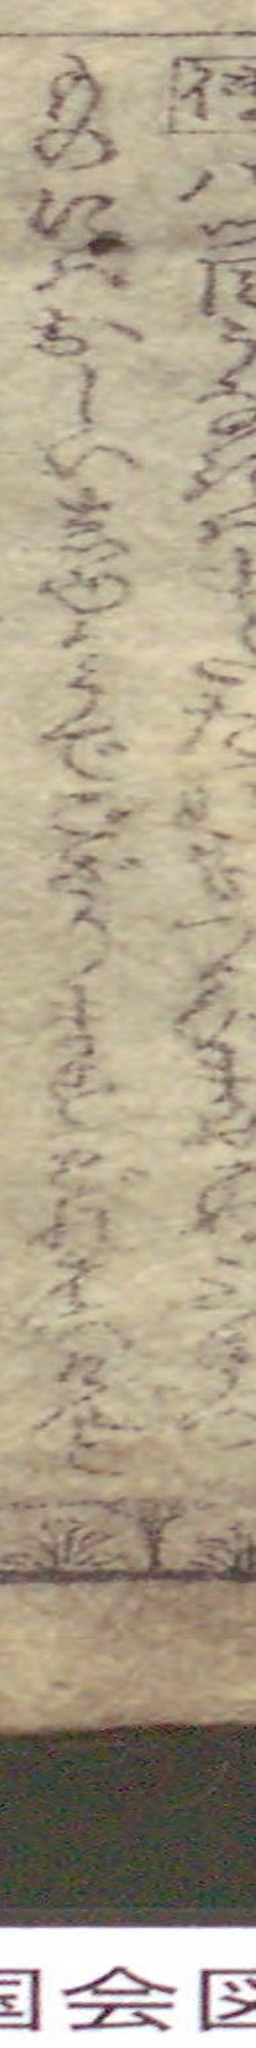ものにはおしいしゆかうでござりますどれはいけんと
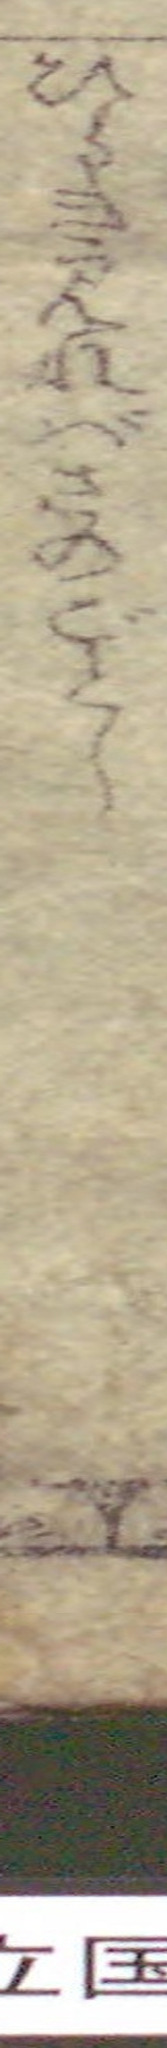ひらき見ればさのごとし

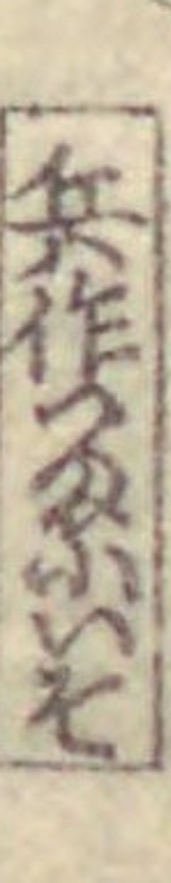兵作つま小いそ
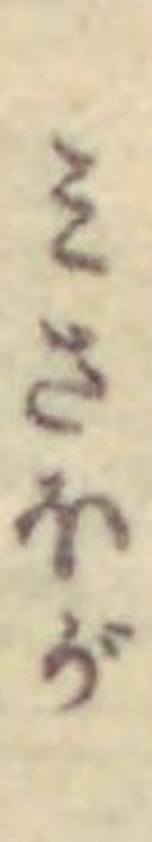みさほが
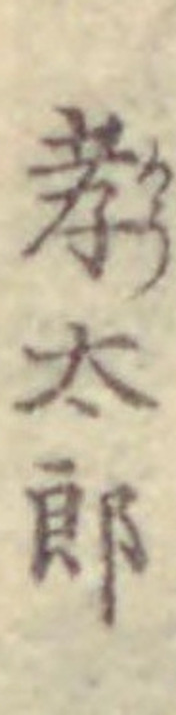孝太郎
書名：八ツ目鱣因縁物語 3巻
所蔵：国立国会図書館 National Diet Library, JAPAN
